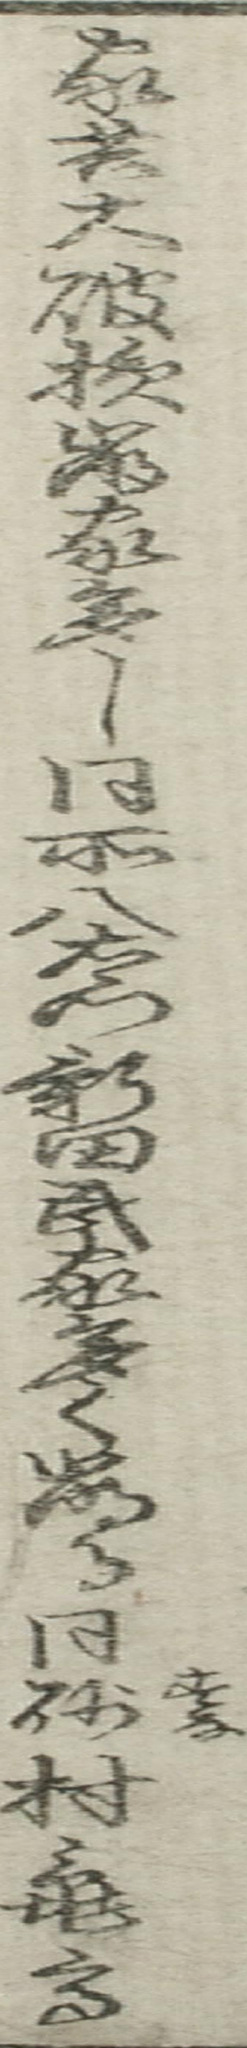家共大破損崩家多し同所八右衛門新田民家多く崩る同砂村亀高
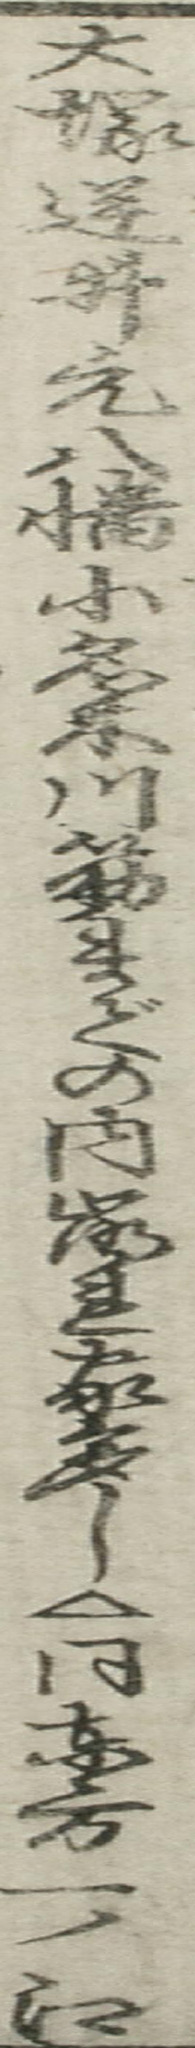大塚逆井元八幡小名木川筋までの内崩れ家多し△同東方一ノ江
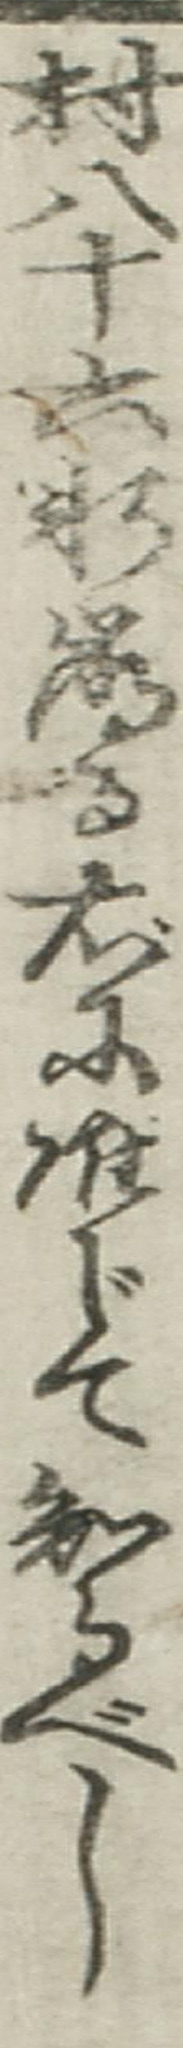村八十六軒崩る右に准じて知るべし
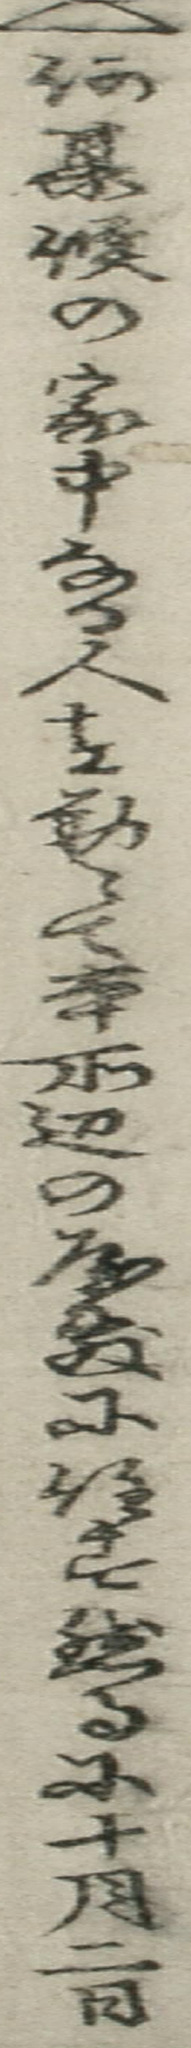△何某候の家中なる人在勤にて本所辺の屋敷に住す然るに十月二日
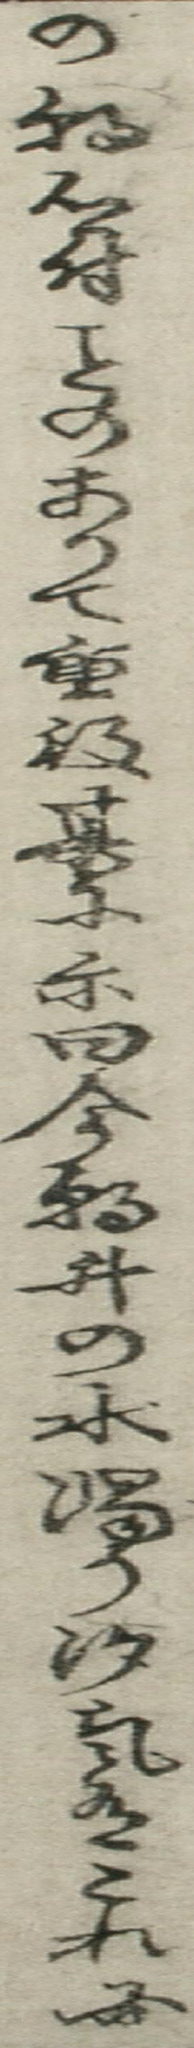の朝心付ことのありて重役某に尓曰今朝井の水濁り汐気有これ必
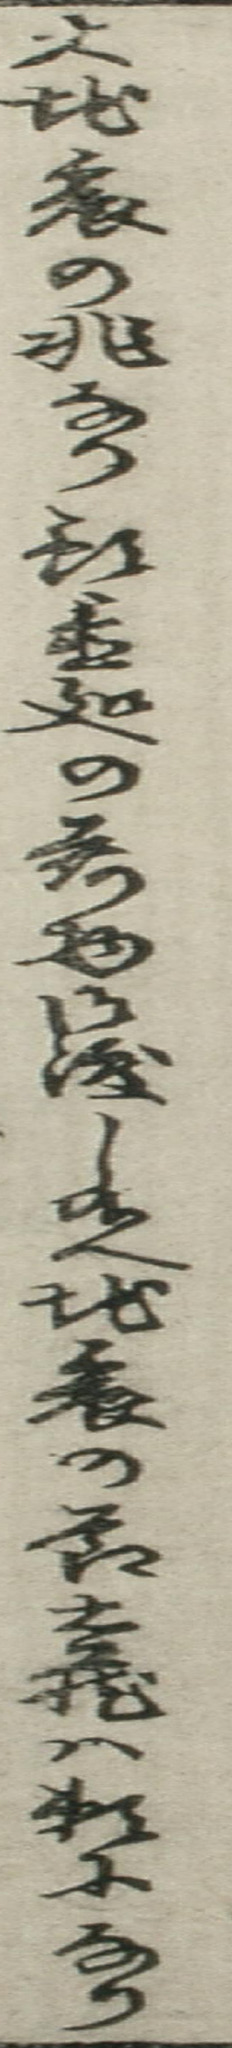大地震の兆なり預置処の荷物御渡し候へ地震の節土蔵は頼になり
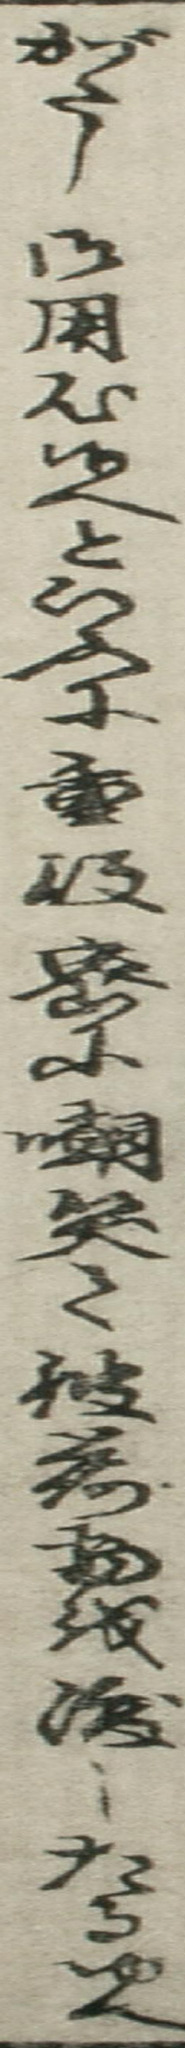がたし御用心候へといふに重役密に嘲笑て彼荷物を渡したるゆへ
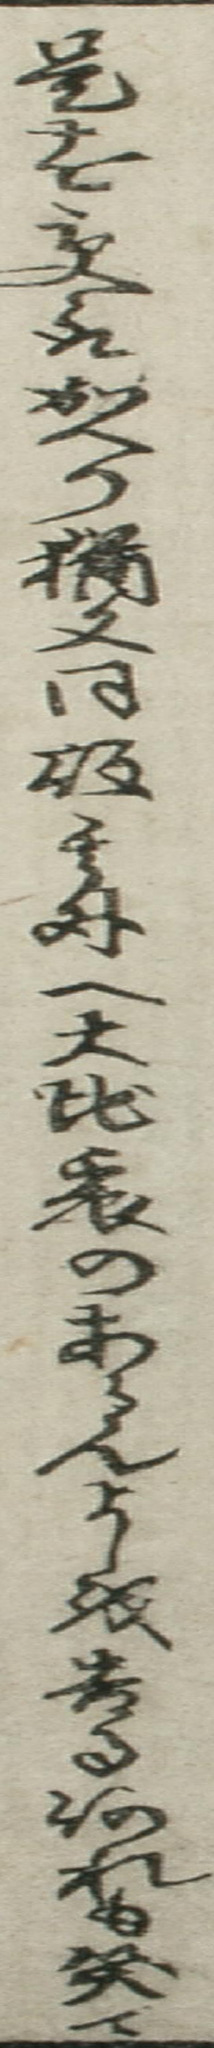是を受取かへり猶又同役其外へ大地震のあらんよしを告る何れも笑て
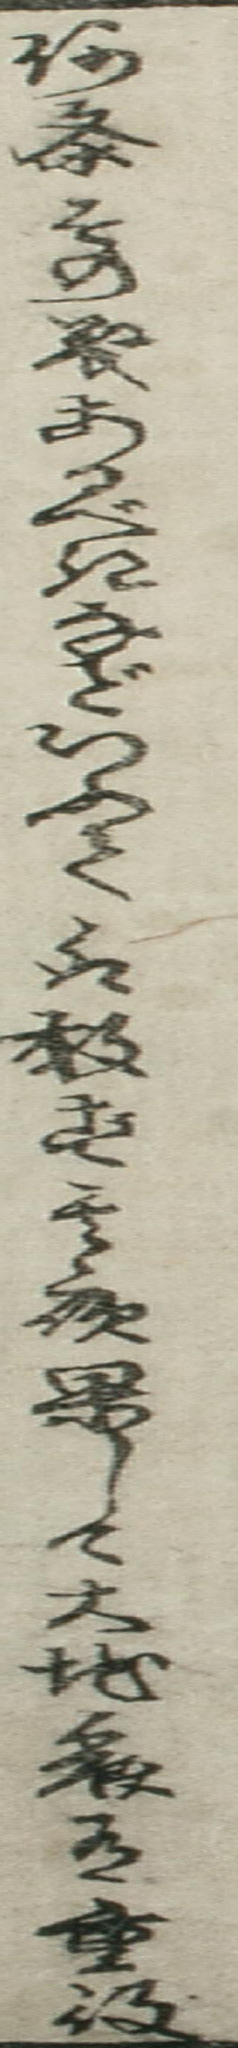何条その義あるべきなどいふて取敢ず其夜果して大地震有重役
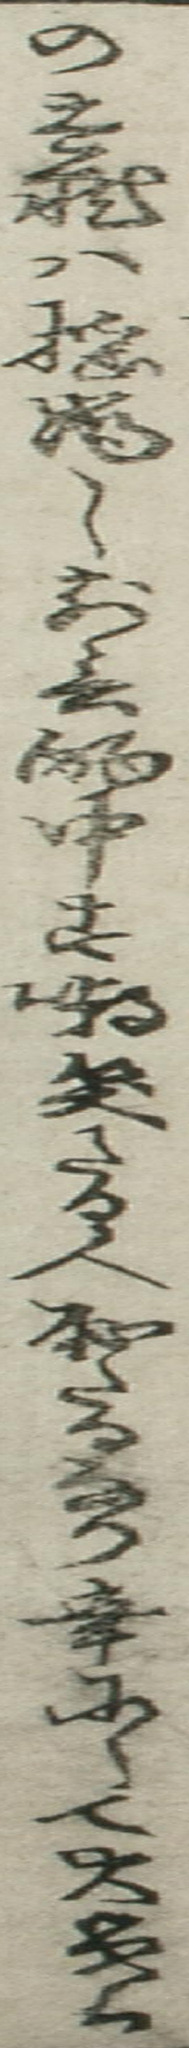の土蔵は揺崩し前言的中す嘲笑たる人恥たるなり幸にして火災は
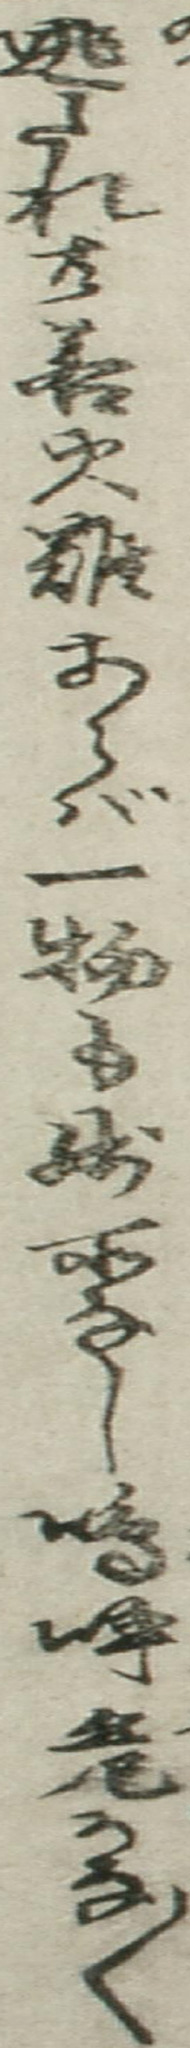逃たれ共若火難あらば一物も残所なし嗚呼危かな〳〵
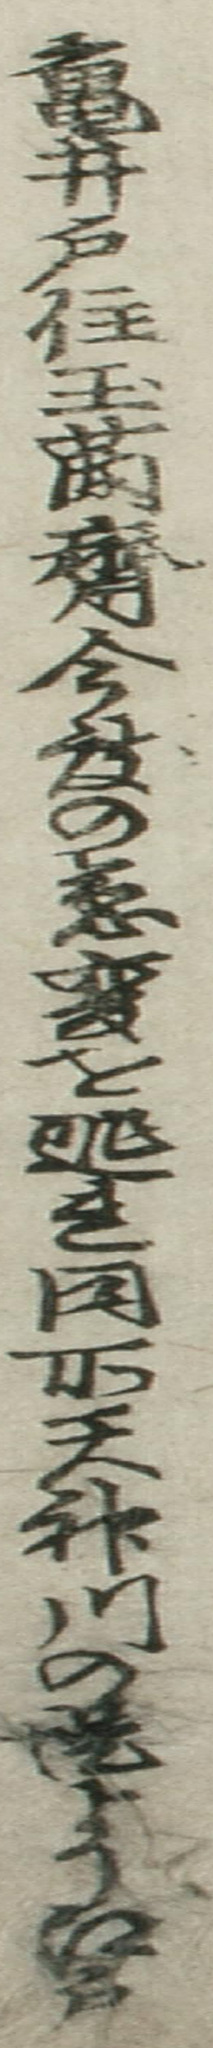亀井戸住玉蘭齋今度の急変を逃れ同所天神川の堤より江戸の
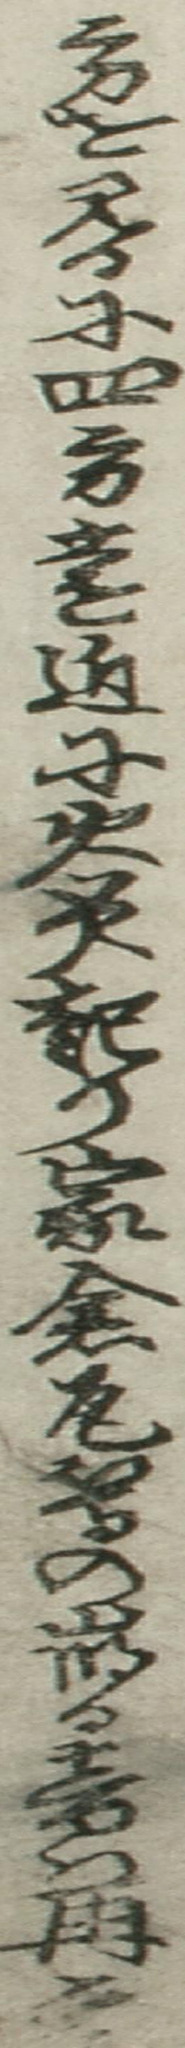方を見るに四方遠近に火災起り家倉瓦等の崩る音は再震動
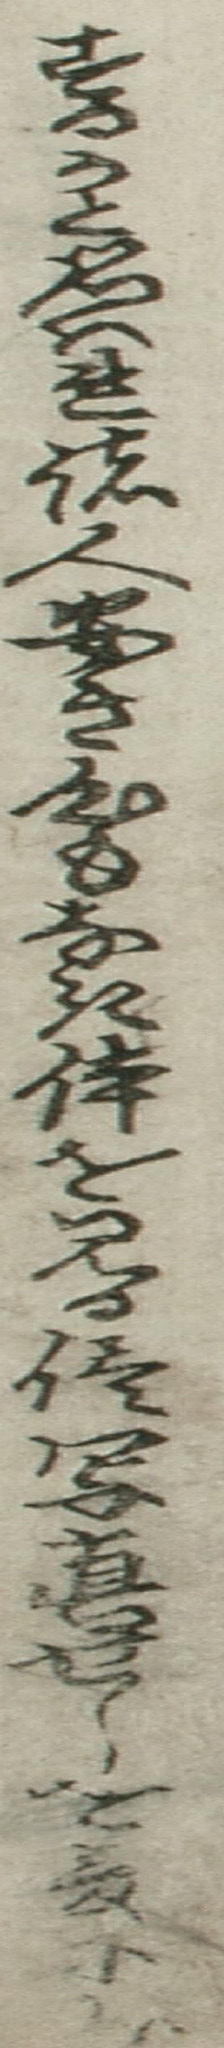するかと思はれ諸人安き心もなき体を見る侭写真せしを爰に書す

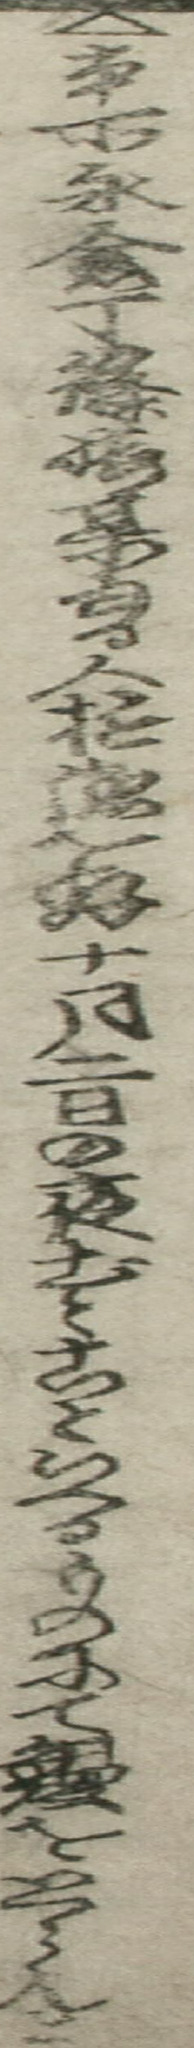△本所永倉丁篠崎某なる人遊漁を好十月二日の夜ずゝこといへるものにて鰻をとらんと
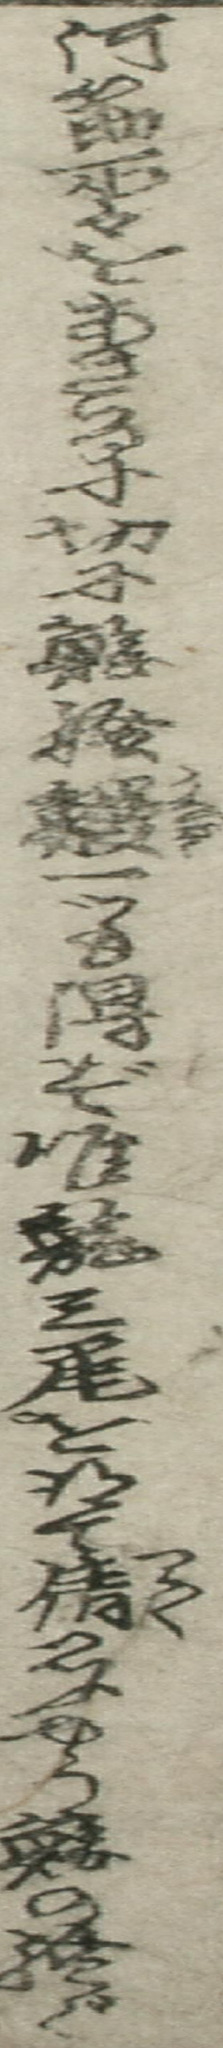何筋所々をあさるに切に鯰騒鰻一ツも得ず唯鯰三尾を得て倩思ふやう鯰の騒ぐ
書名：安政見聞誌　上
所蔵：東京大学地震研究所図書室 Earthquake Research Institute Library, The University of Tokyo, JAPAN
